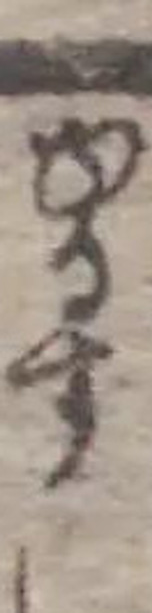ゆるす
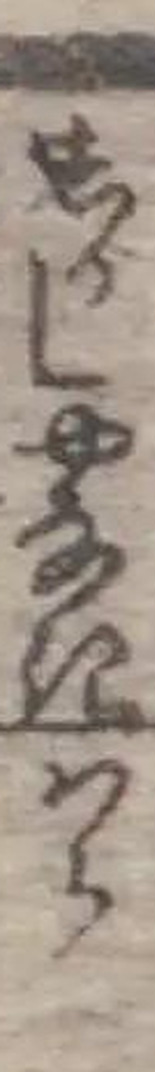しかしやなきはら
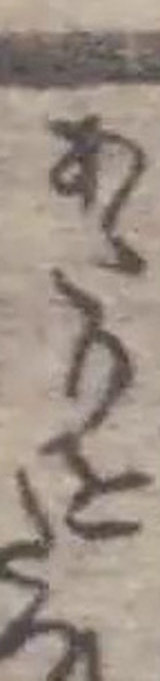あたりを

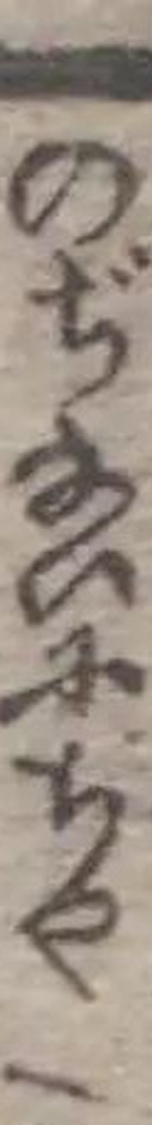のぢないにちや
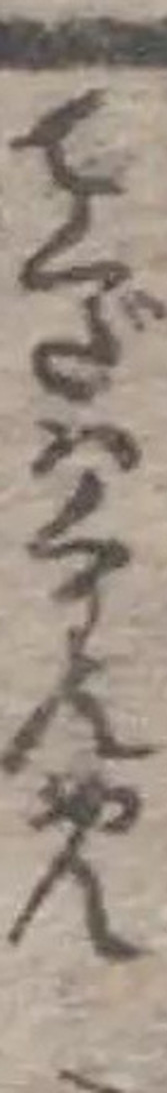てくだはくわんおん
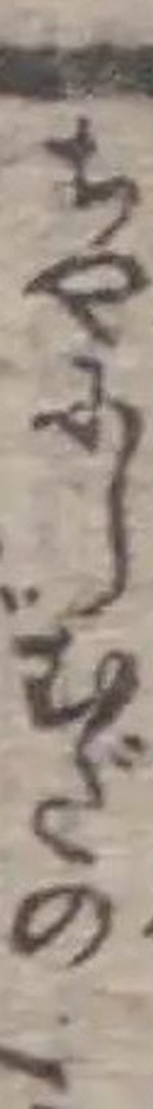ちやにしむだの
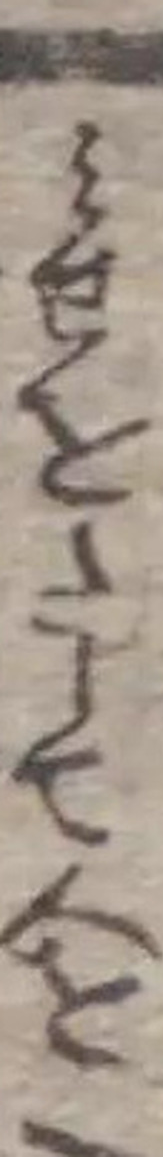みせをたして人を
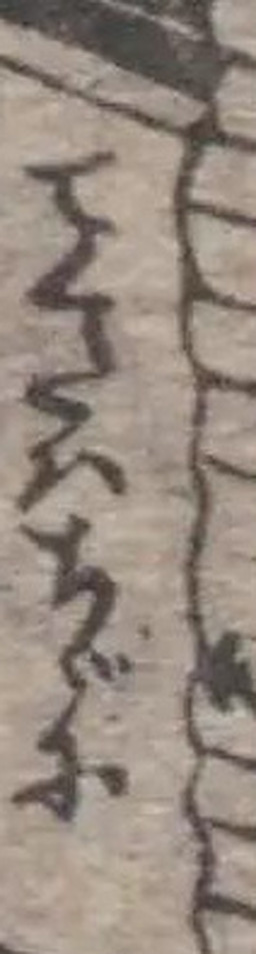てくたはちゞに
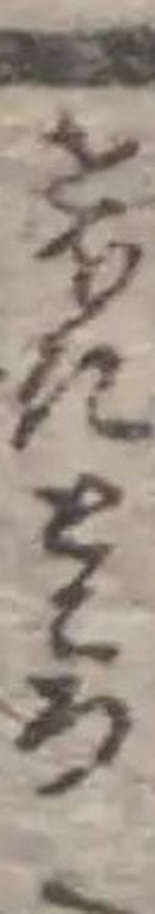とほきところ
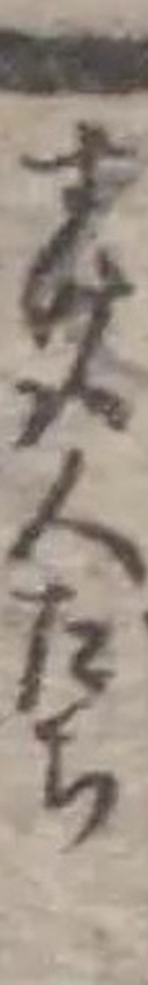すけは人だち
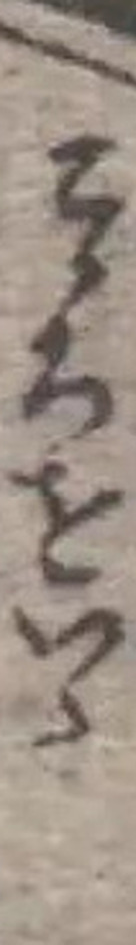こゝろをいた
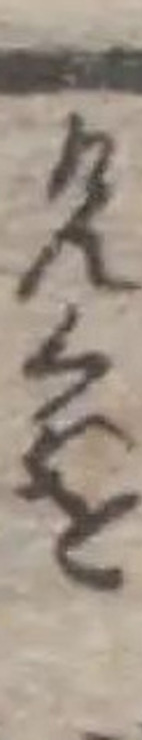けんくはを
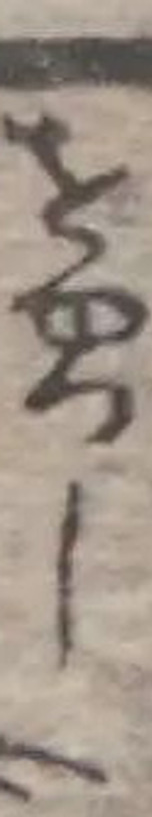をやつし
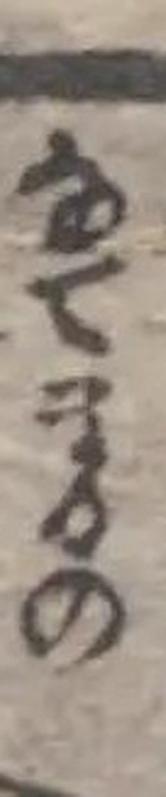なてまるの
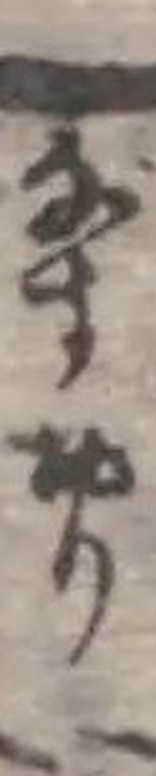なすおり
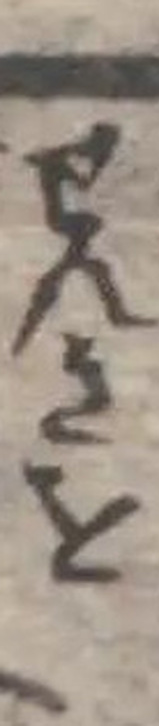せんきを
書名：富多高慢噺 3巻
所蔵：国立国会図書館 National Diet Library, JAPAN
